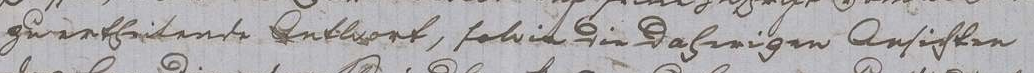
zu ertheilende Antwort, sowie die daherigen Ansichten
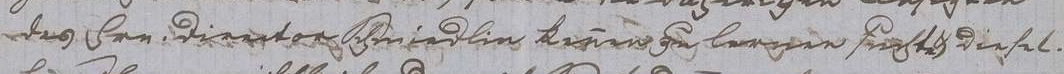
des Hrn. Director Schmiedlin kennen zu lernen suchte & diesel-
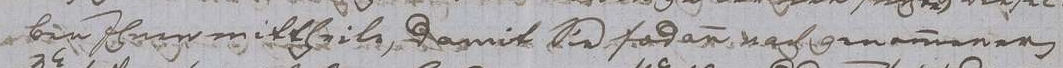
ben Ihnen mittheile, damit Sie sodann nach genommener
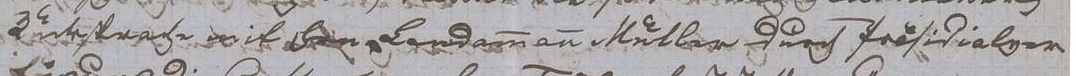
Rücksprache mit Hrn Landammann Müller durch Präsidialver-
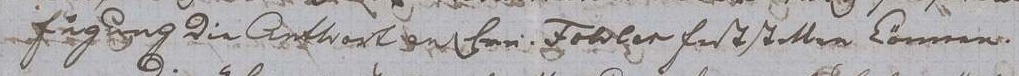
fügung die Antwort an Hrn. Fowler feststellen können.
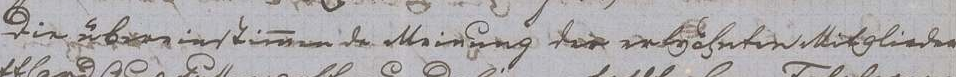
Die übereinstimmende Meinung der erwähnten Mitglieder
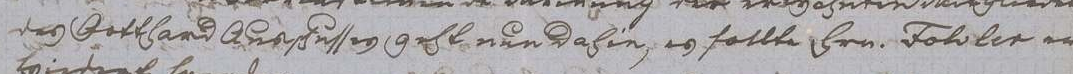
des Gotthard Ausschusses geht nun dahin, es sollte Hrn. Fowler er-
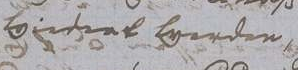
wiedert werden,
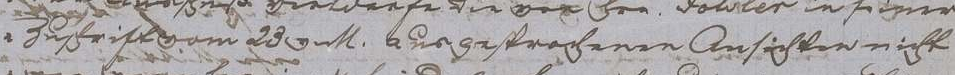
Zuschrift vom 23 v. M. ausgesprochenen Ansichten nicht
